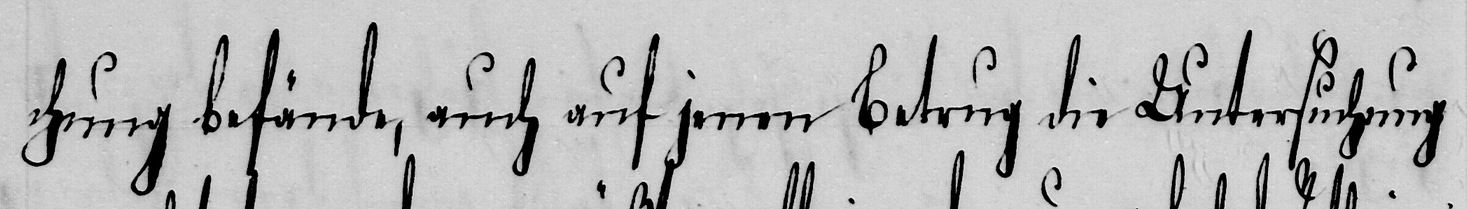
chung befände, auch auf jenen Betrug die Untersuchung
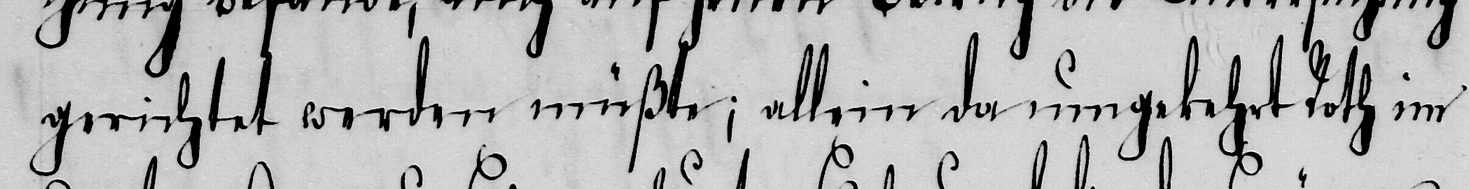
gerichtet werden müßte; allein da umgekehrt Roth im
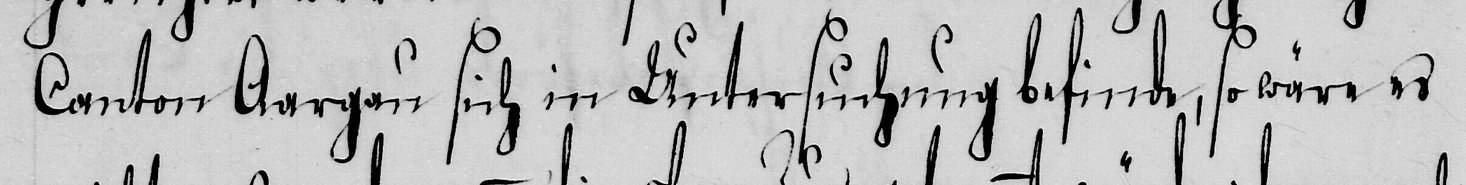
Canton Aargau sich in Untersuchung befinde, so wäre es
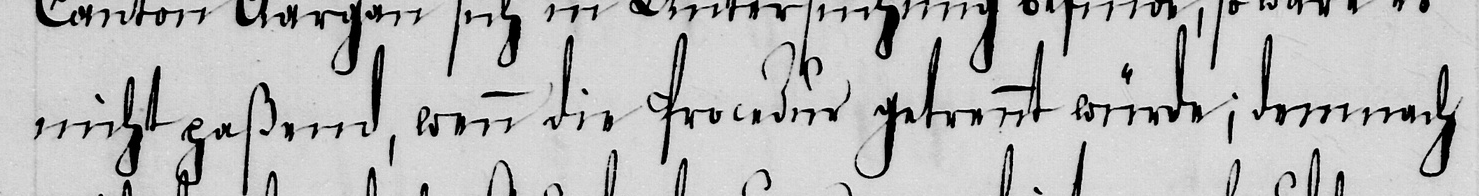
nicht paßend, wenn die Procedur getrennt würde; demnach
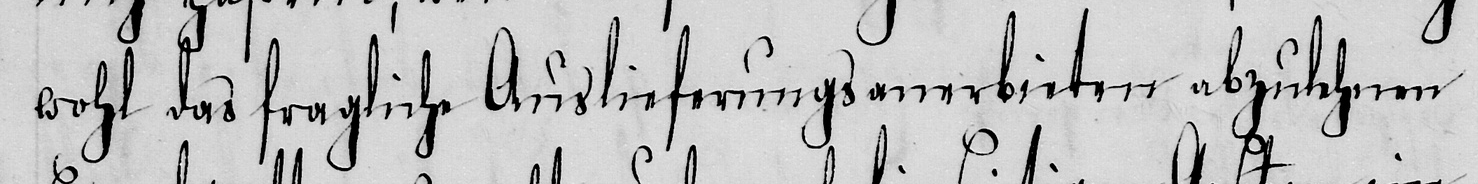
wohl das fragliche Auslieferungsanerbieten abzulehnen
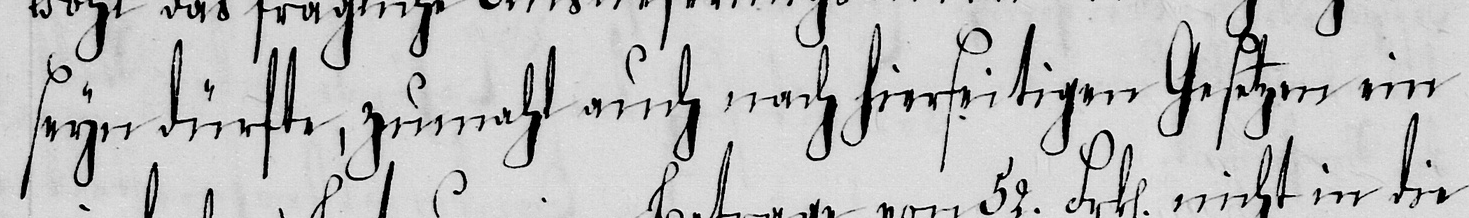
seyn dürfte, zumahl auch nach hierseitigen Gesetzen ein
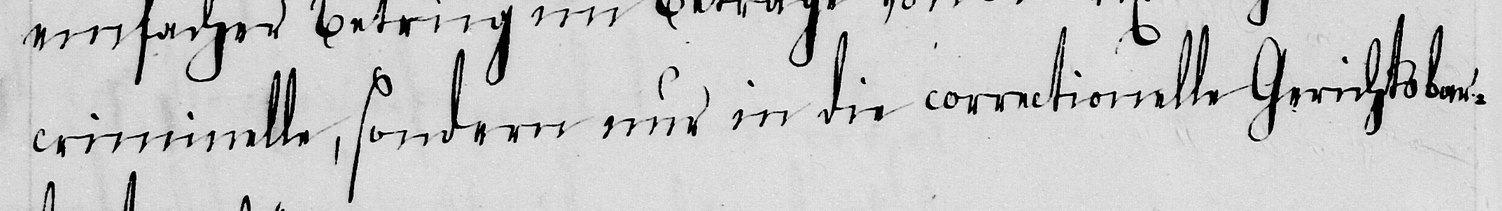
criminelle, sondern nur in die correctionelle Gerichtsbar¬
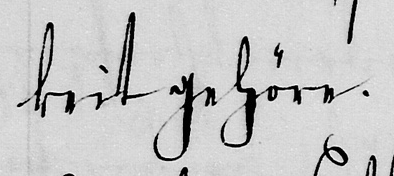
keit gehöre.
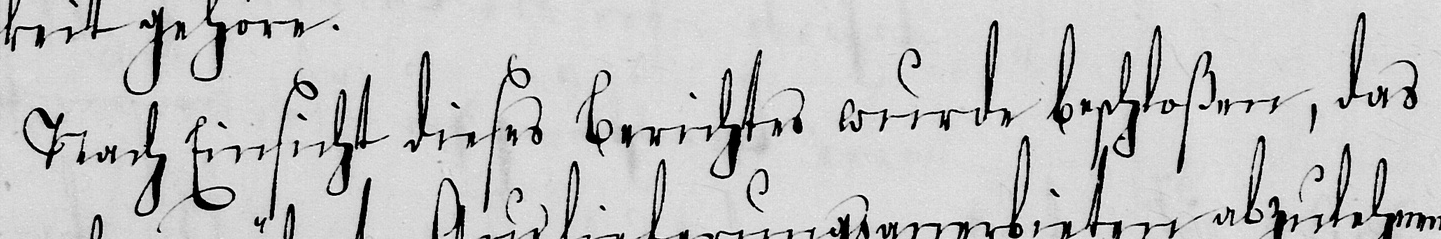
Nach Einsicht dieses Berichtes wurde beschloßen, das
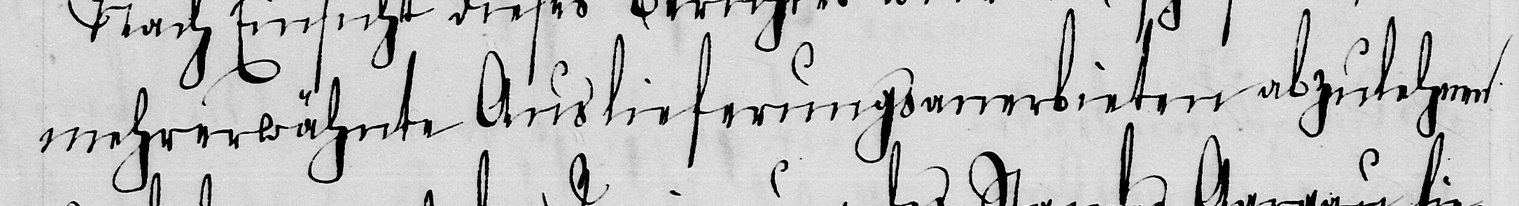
mehrerwähnte Auslieferungsanerbieten abzulehnen
